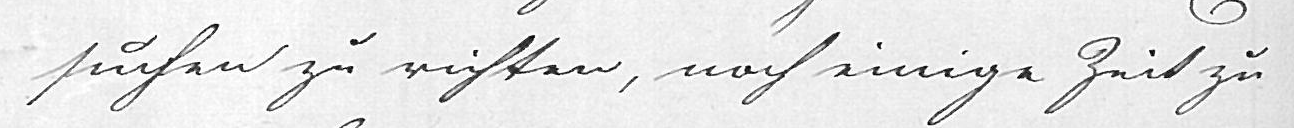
suchen zu richten, noch einige Zeit zu
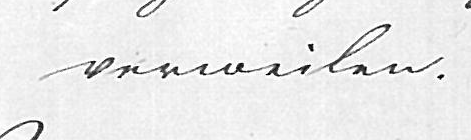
verweilen.
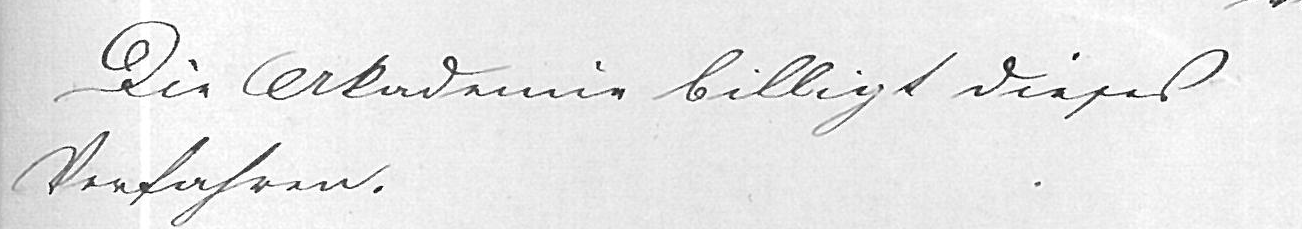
Die Akademie billigt dieses
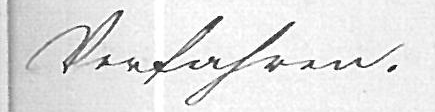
Verfahren.
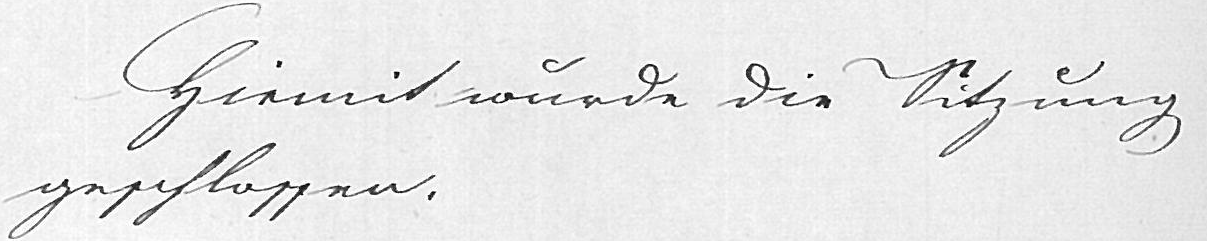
Hiemit wurde die Sitzung
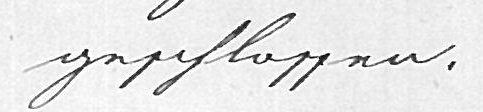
geschlossen.
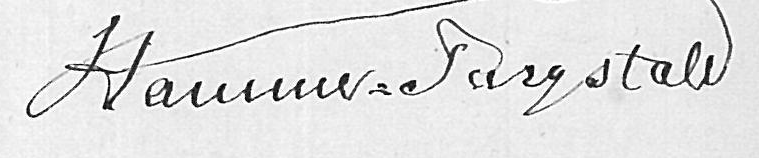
Hammer-Purgstall
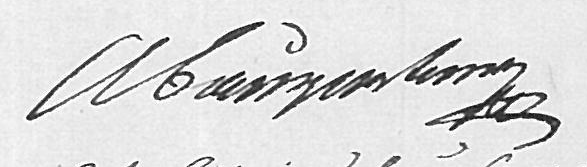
ABaumgartner
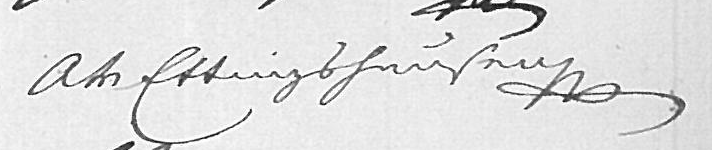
AvEttingshausen
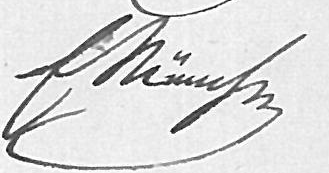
EMünch
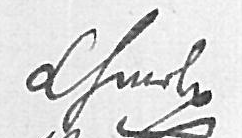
Chmel
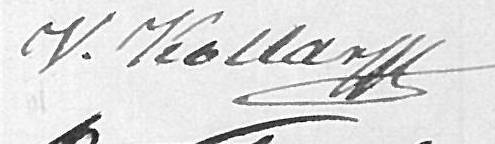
V. Kollar
